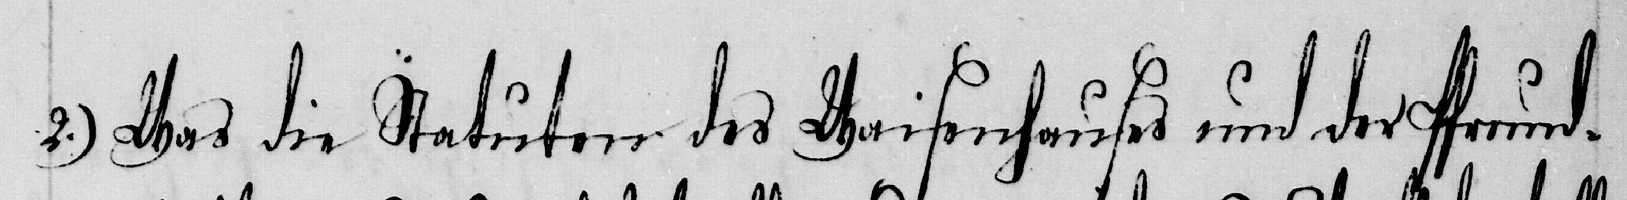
2.) Was die Statuten des Waisenhauses und der Pfrund¬
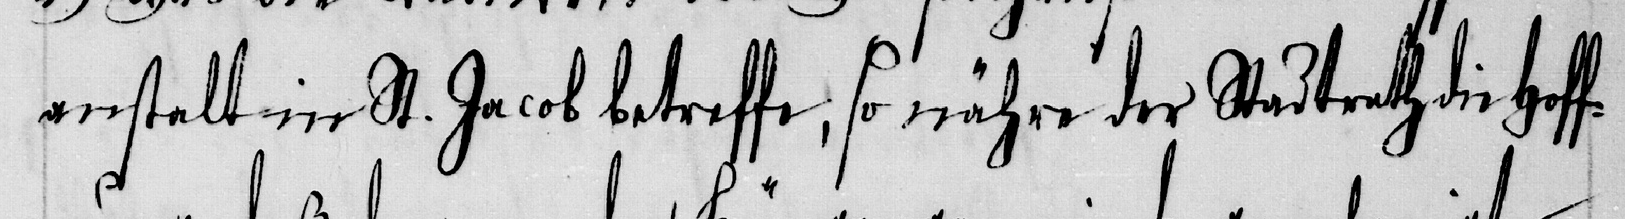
anstalt in St. Jacob betreffe, so nähre der Stadtrath die Hof¬
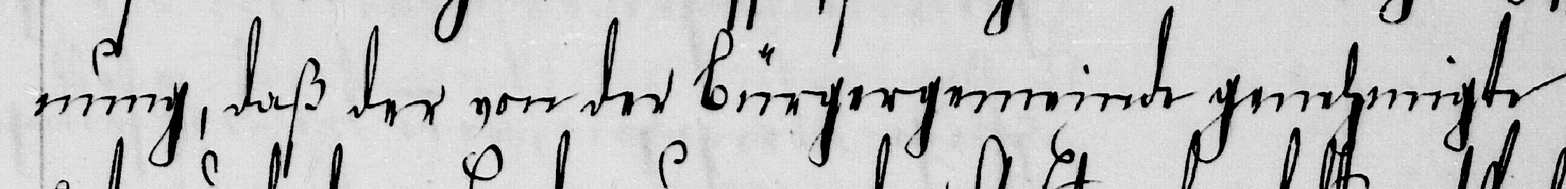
fnung, daß der von der Bürgergemeinde genehmigte
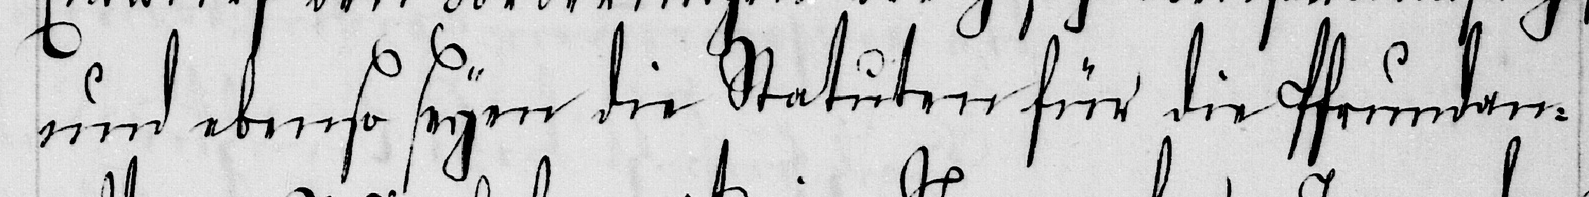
und ebenso seyen die Statuten für die Pfrundan¬
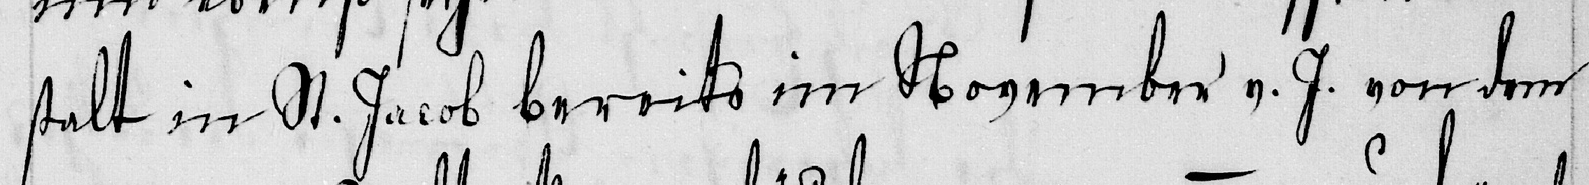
stalt in St. Jacob bereits im November v. J. von dem
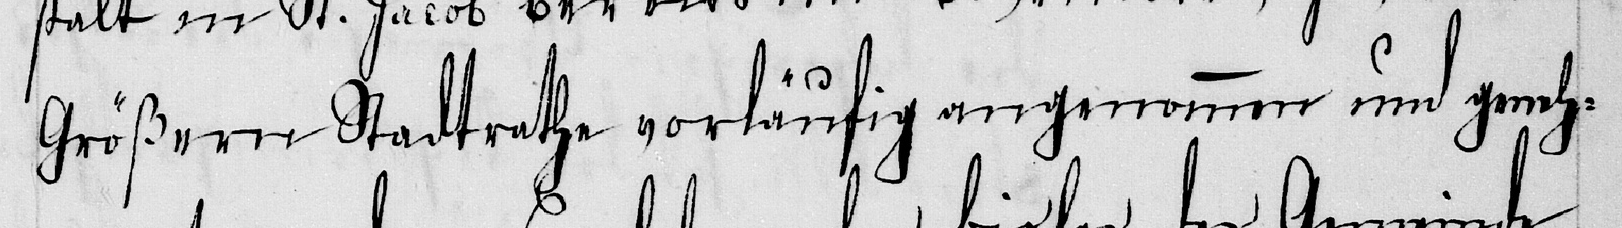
Größern Stadtrath vorläufig angenommen und geneh¬
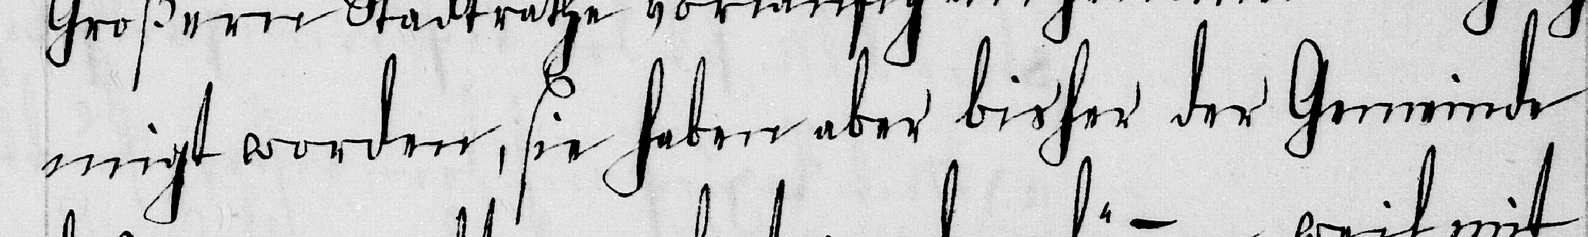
migt worden, sie haben aber bisher der Gemeinde
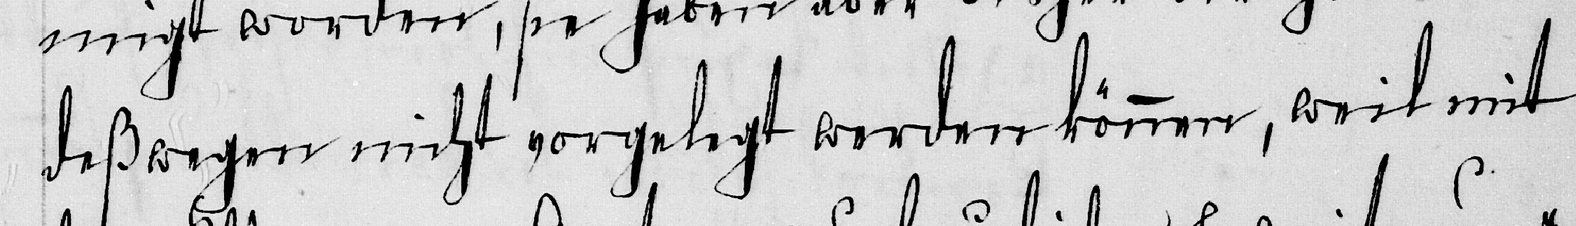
deßwegen nicht vorgelegt werden können, weil mit
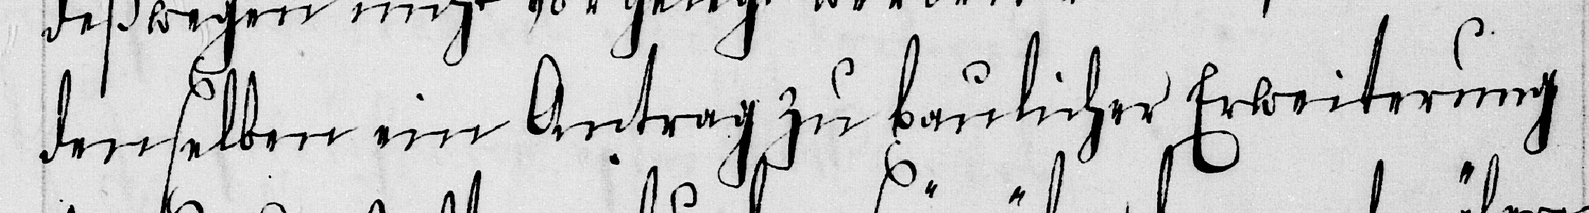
denselben ein Antrag zu baulicher Erweiterung
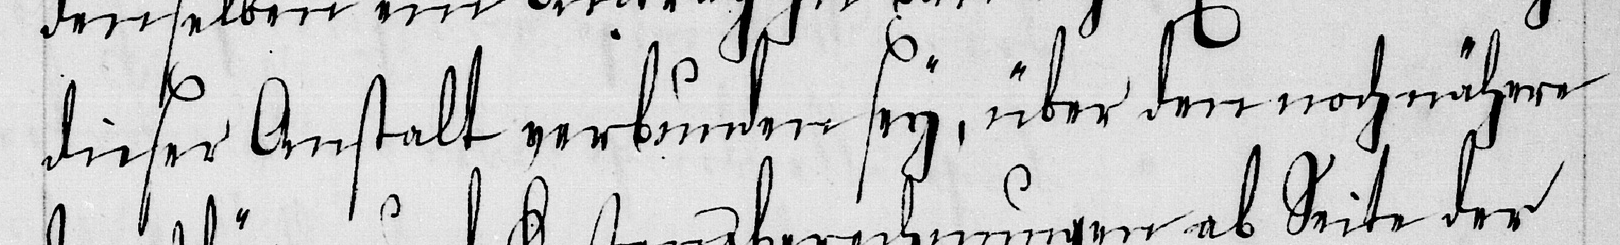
dieser Anstalt verbunden sey, über den noch nähere
